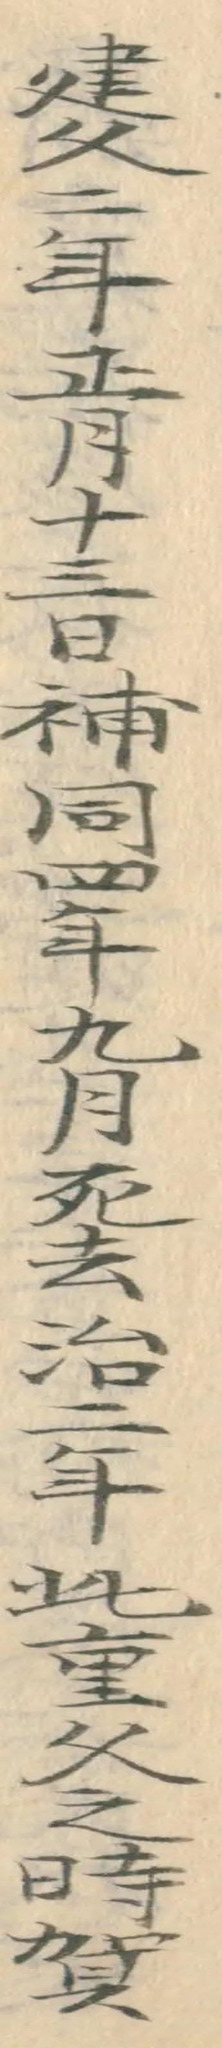建久二年正月十三日補同四年九月死去治二年此重久之時賀

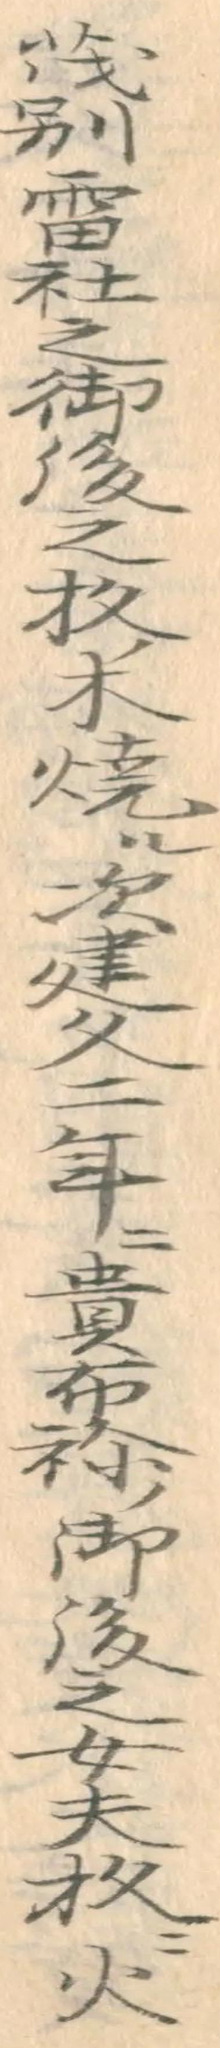茂別雷社之御後之杉ノ木焼ル次建久二年ニ貴布祢ノ御後之女夫杉ニ火
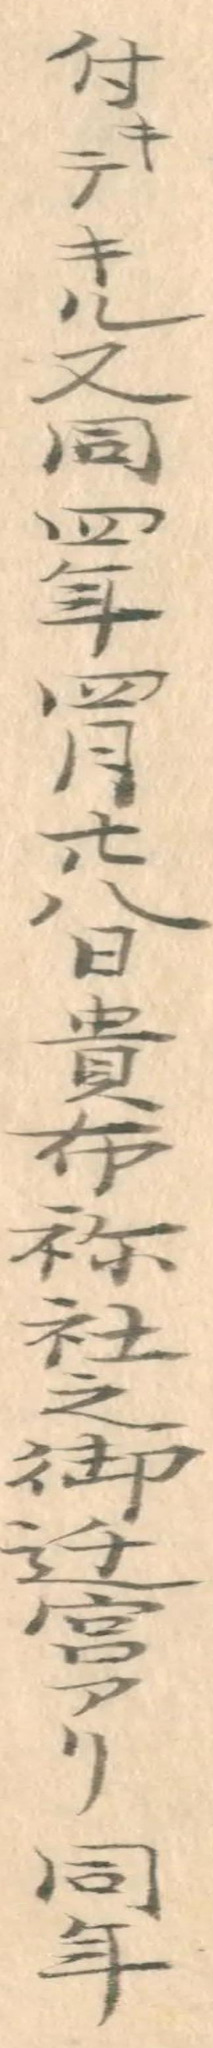付キテキル又同四年四月廿八日貴布祢社之御遷宮アリ同年
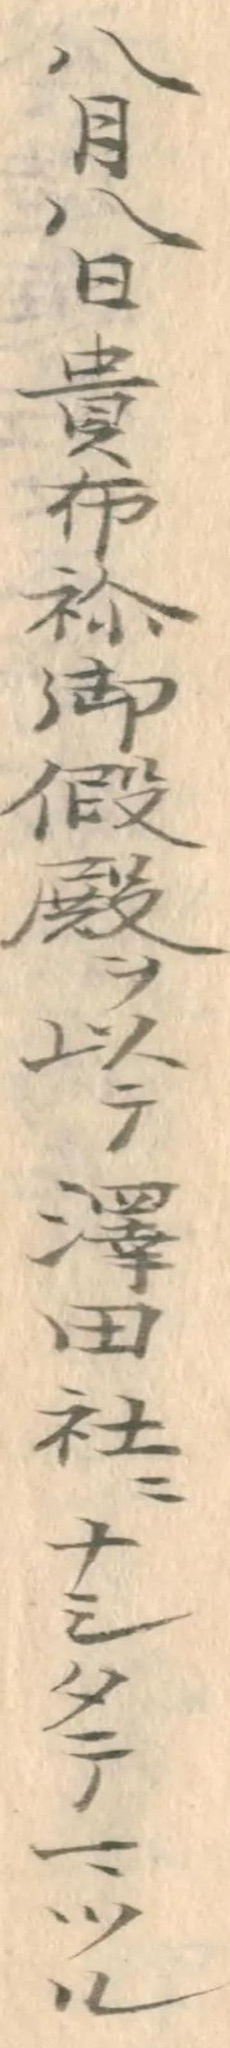八月八日貴布祢御仮殿ヲ以テ沢田社ニナシタテマツル
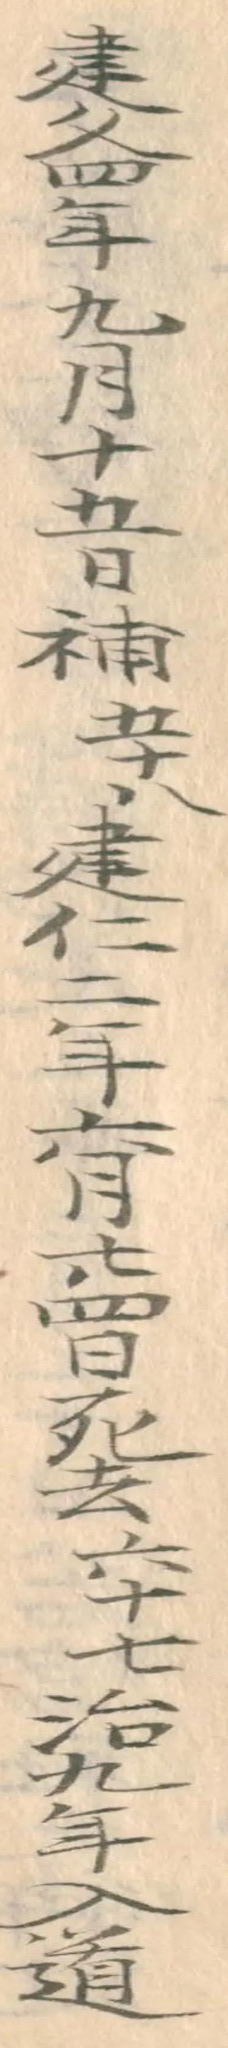建久四年九月十五日補五十八建仁二年六月廿四日死去六十七治九年入道
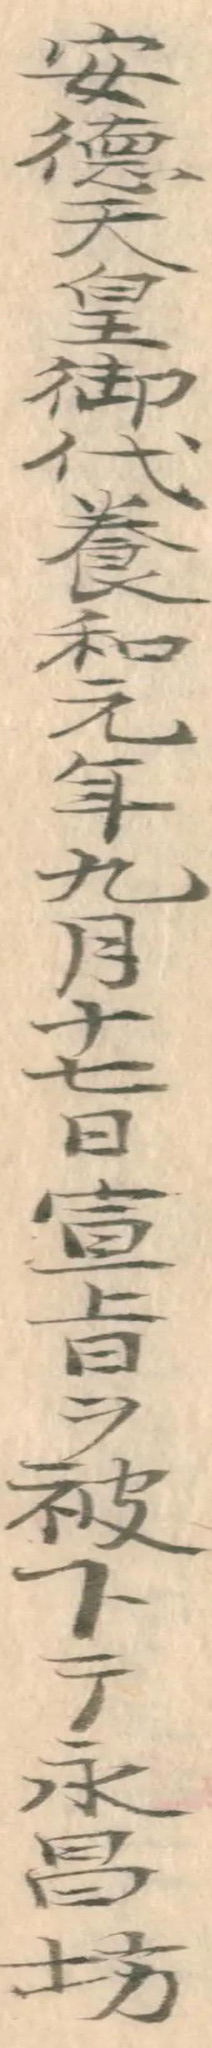安徳天皇御代養和元年九月十七日宣旨ヲ被下テ永昌坊
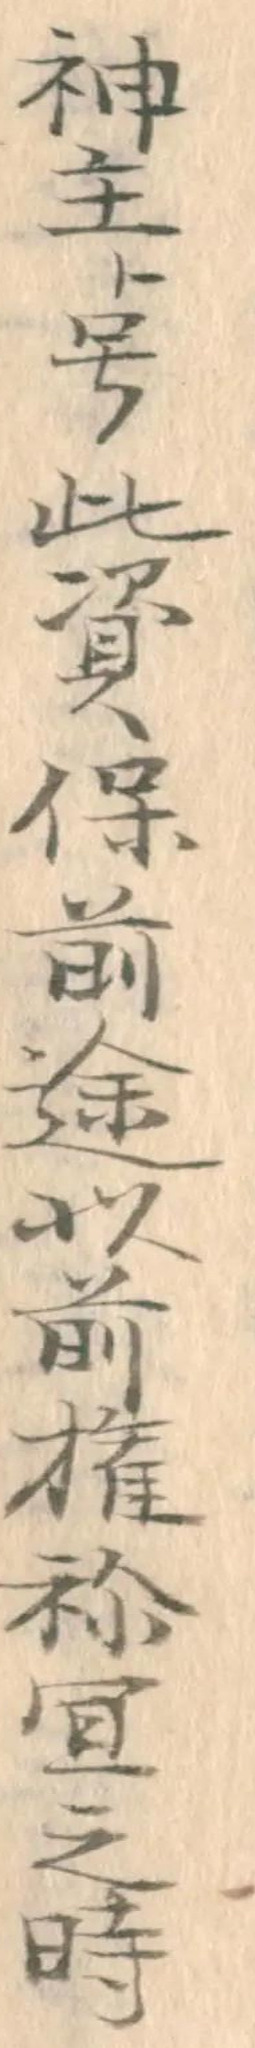神主ト号此資保前途以前権祢宜之時
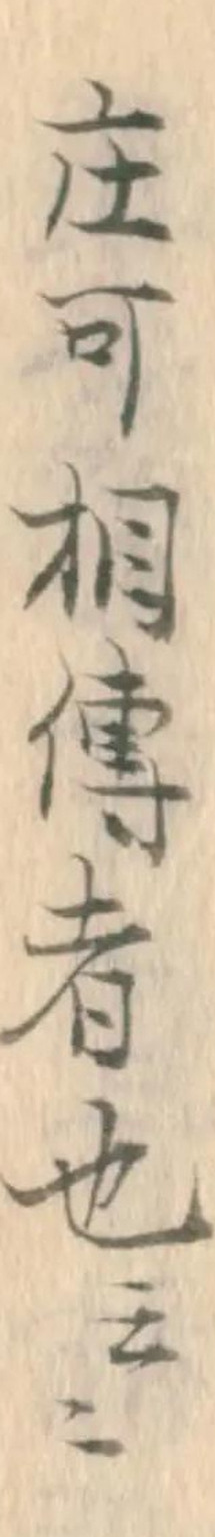庄可相伝者也云々
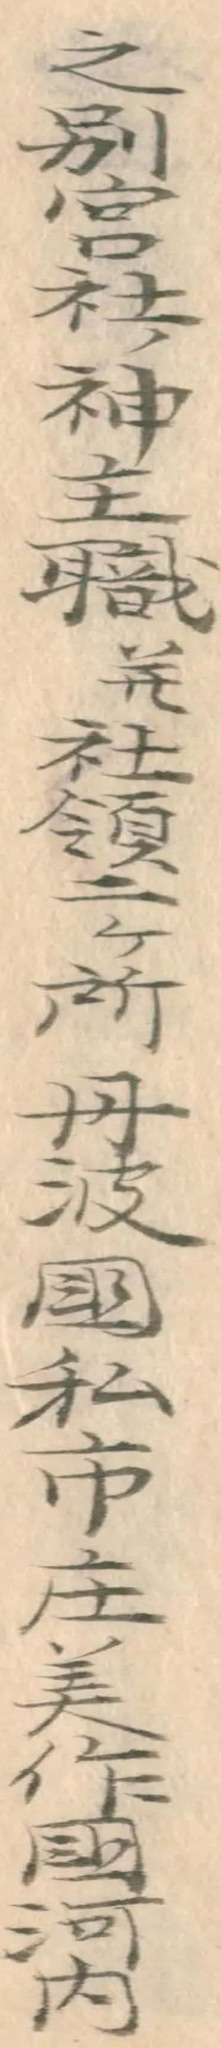之別宮社ノ神主職并社領二ケ所丹波国私市庄美作国河内
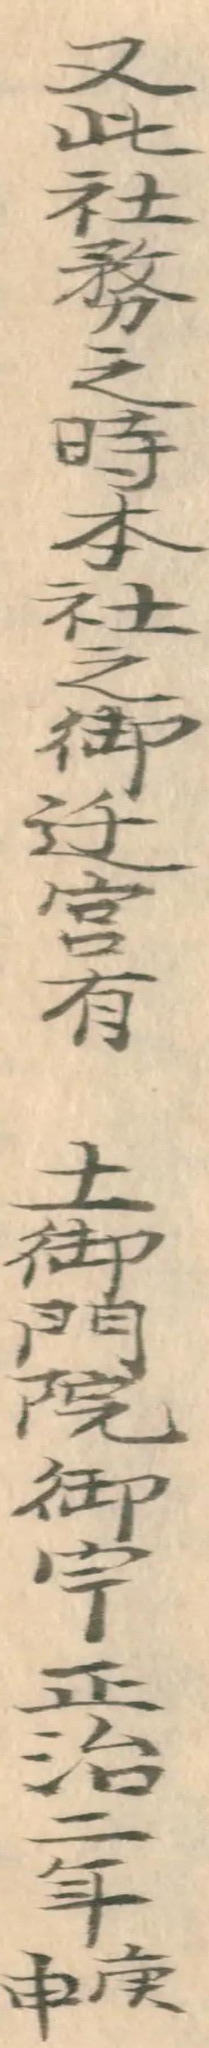又此社務之時本社之御遷宮有土御門院御宇正治二年庚申
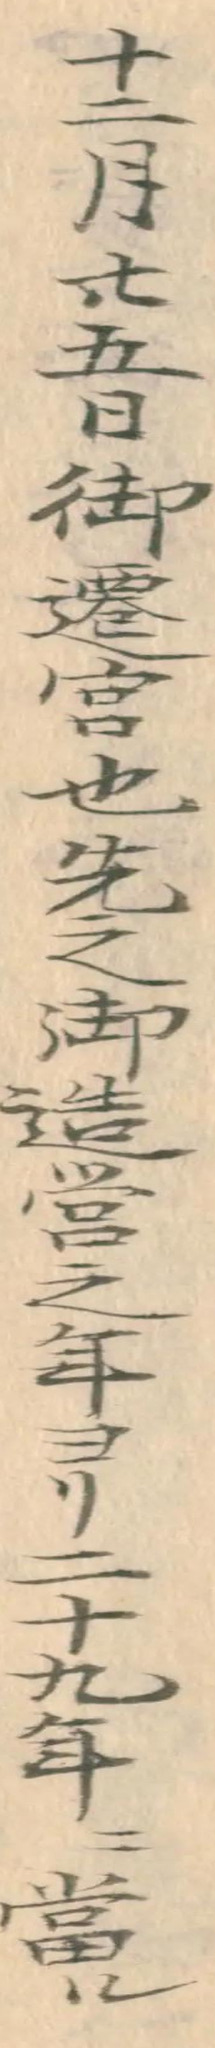十二月廿五日御遷宮也先之御造営之年ヨリ二十九年ニ当ル
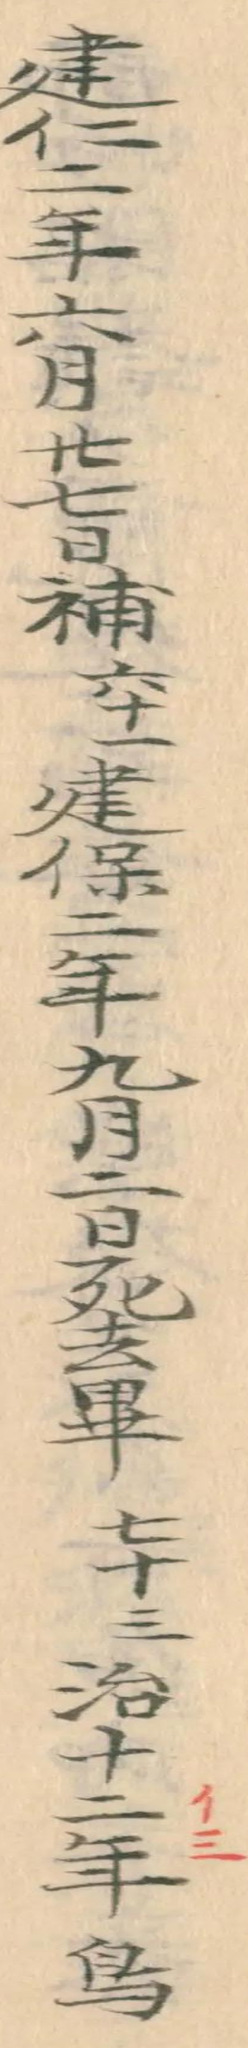建仁二年六月廿七日補六十一建保二年九月二日死去畢七十三治十二年鳥
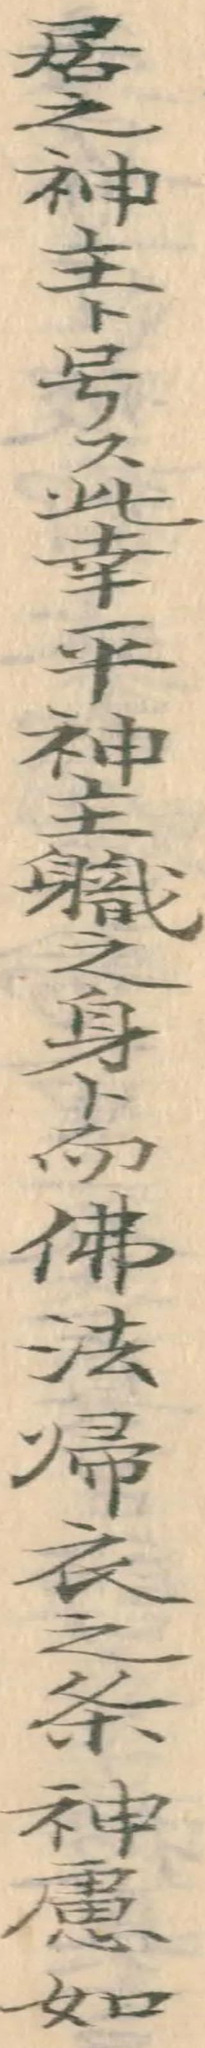居之神主ト号ス此幸平神主職之身ト而仏法帰衣之条神慮如
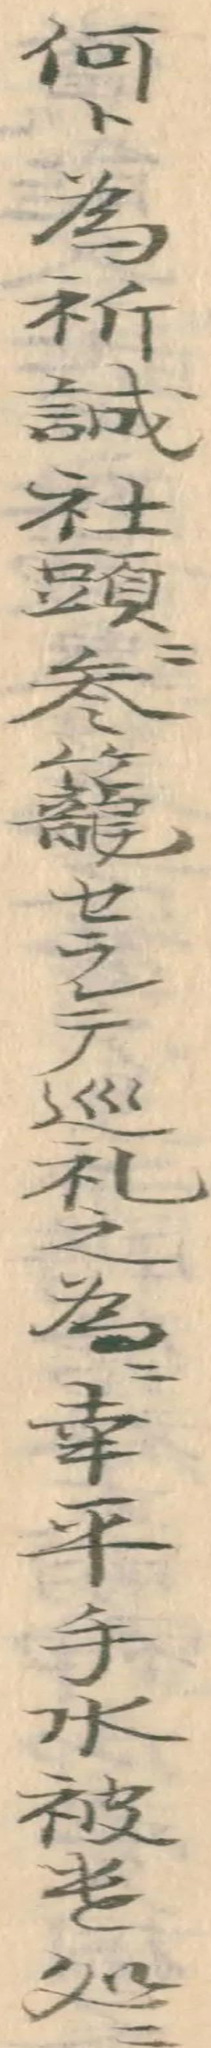何ト為祈誠社頭ニ参籠セラレテ巡礼之為ニ幸平手水被遣処ニ
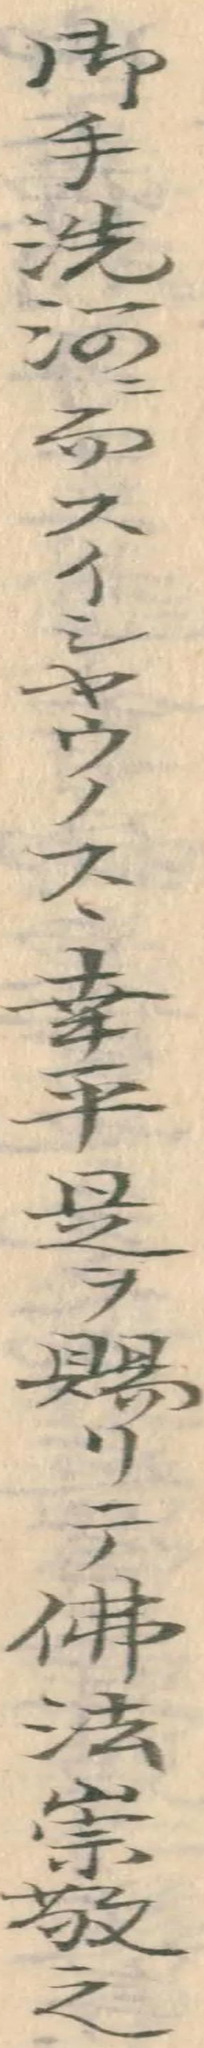御手洗河ニ而スイシヤウノスヽ幸平是ヲ賜リテ仏法崇敬之
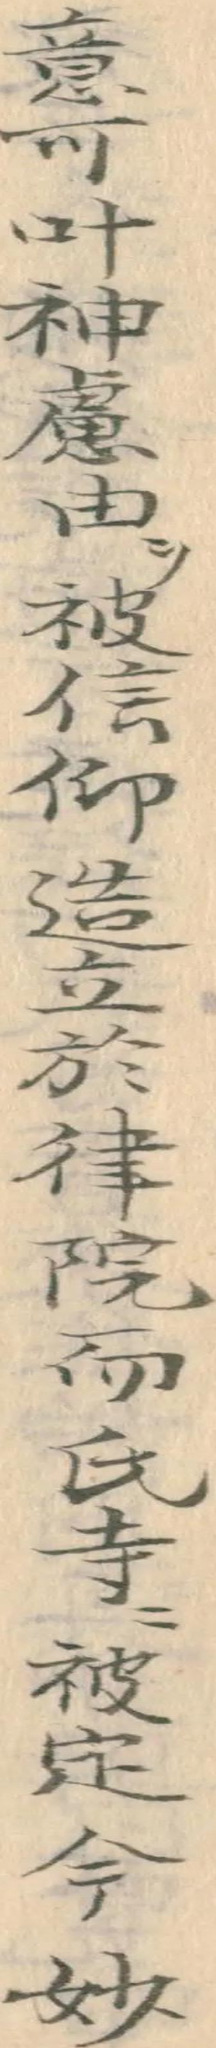意可叶神慮由ヲ被信仰造立於律院而氏寺ニ被定今妙
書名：賀茂社記録. 第24冊
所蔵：国立国会図書館 National Diet Library, JAPAN
